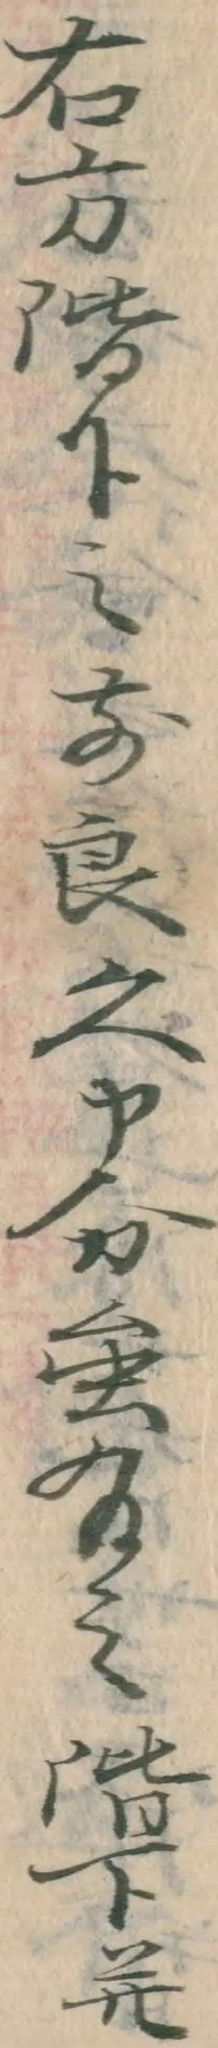右方階下之前良久申分雖有之階下并
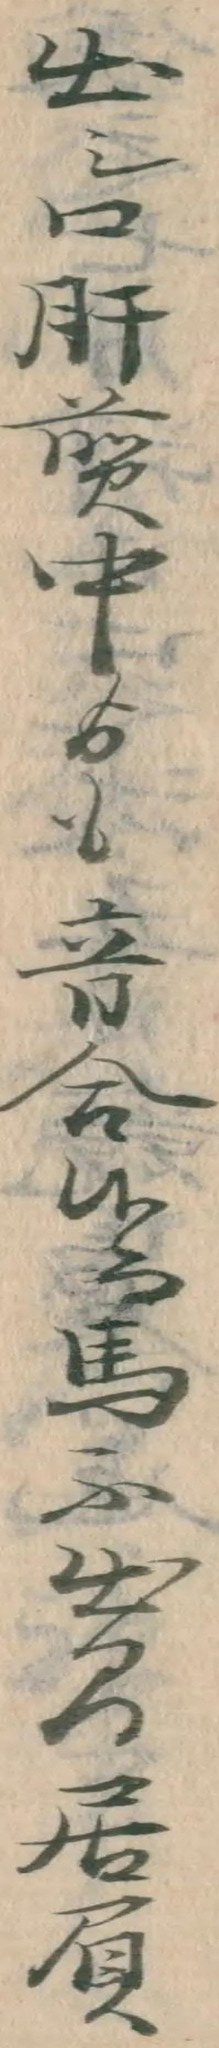出シ口肝煎中ゟも音合候而馬不出間居負
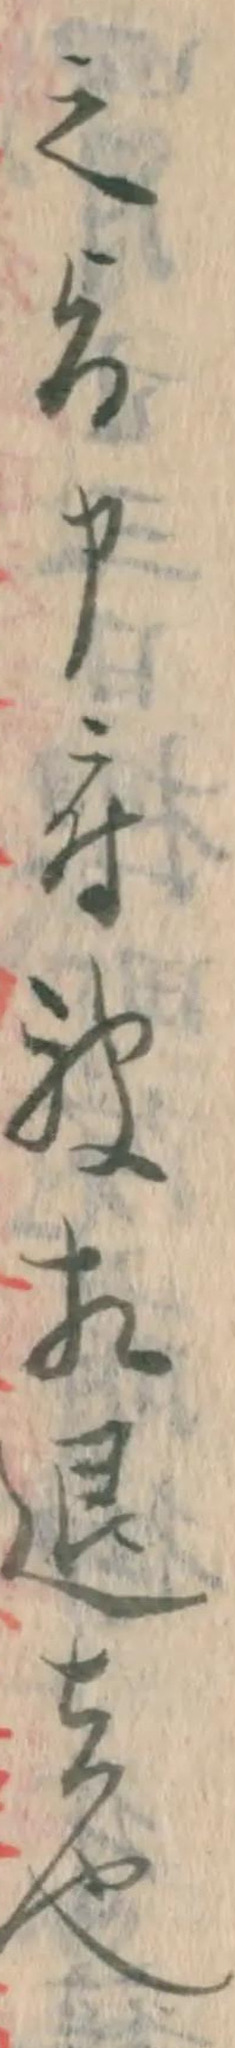之旨申ニ付被相退去也
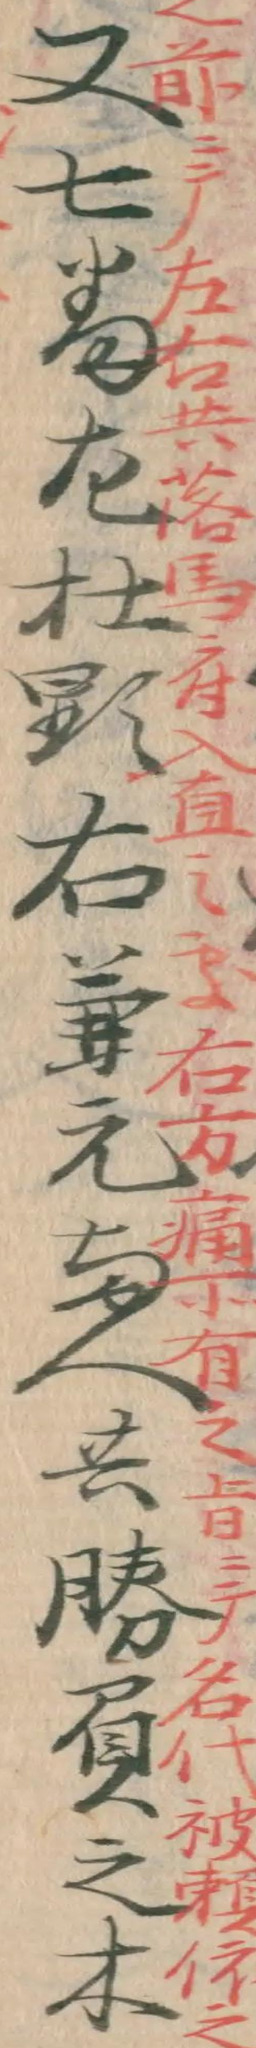又七番左杜顕右兼元両人共勝負之木
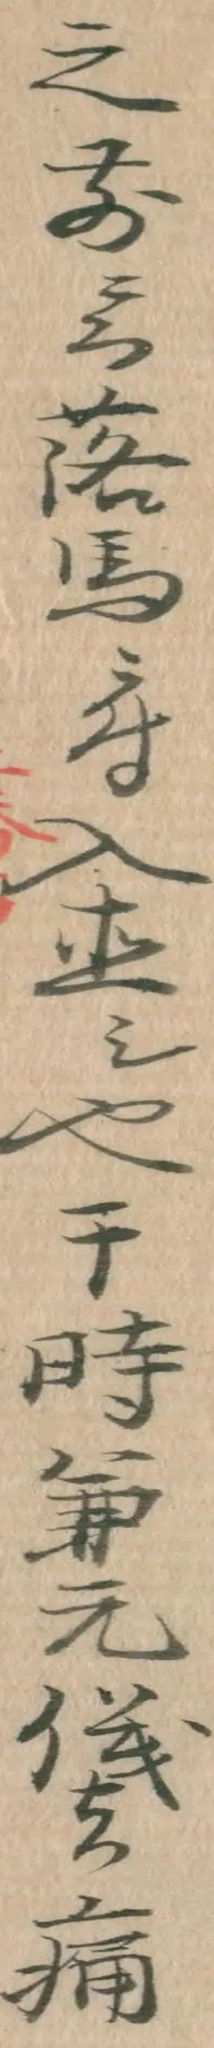之前ニ而落馬ニ付入直シ也于時兼元儀者痛
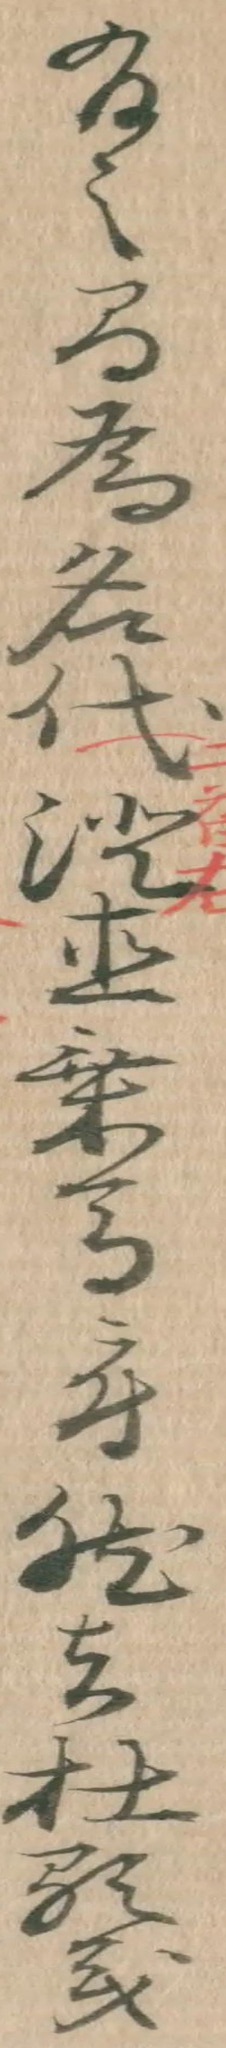有之間為名代澄直乗馬ニ付然者杜顕義
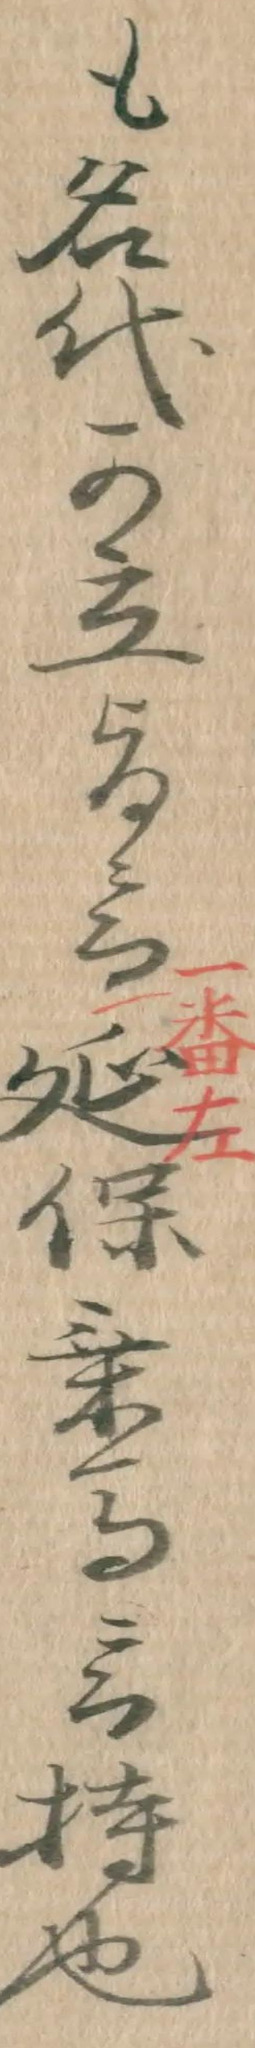も名代可立旨ニ而延保乗馬ニ而持也
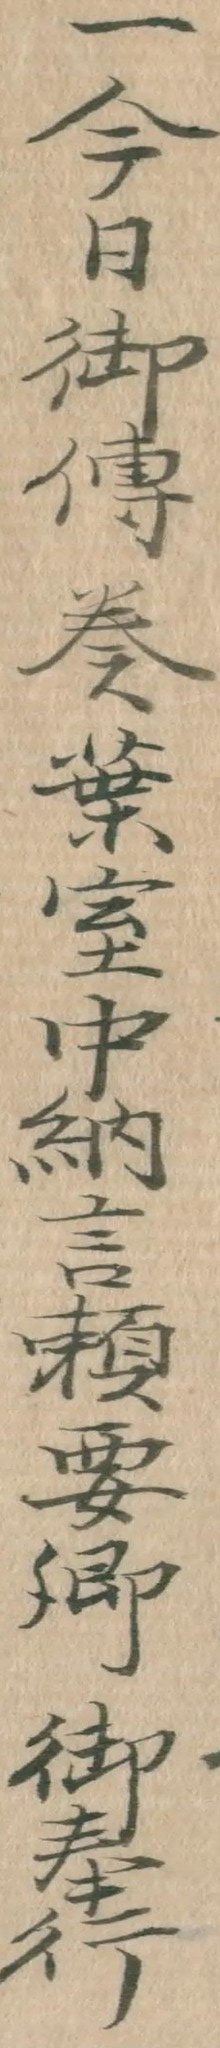一今日御伝奏葉室中納言頼要卿御奉行
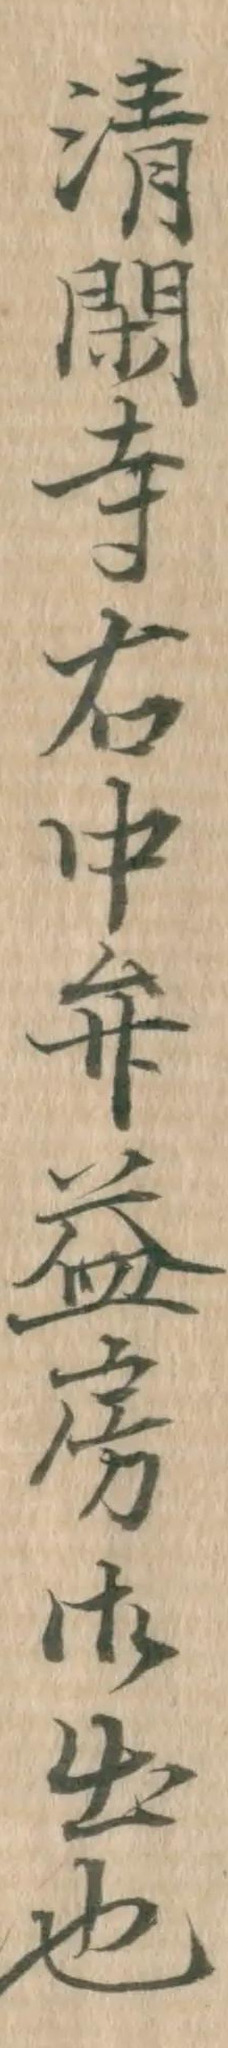清閑寺右中弁益房御出也

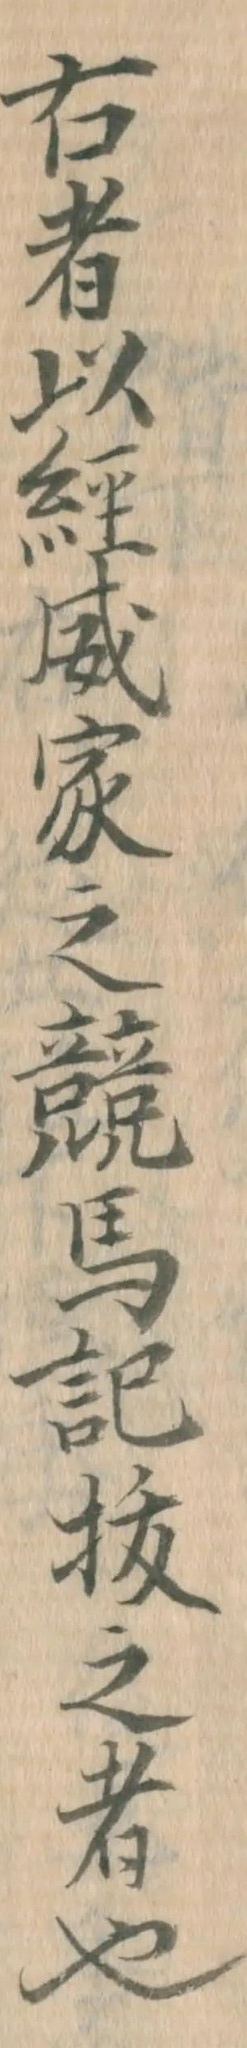右者以経威家之競馬記抜之者也
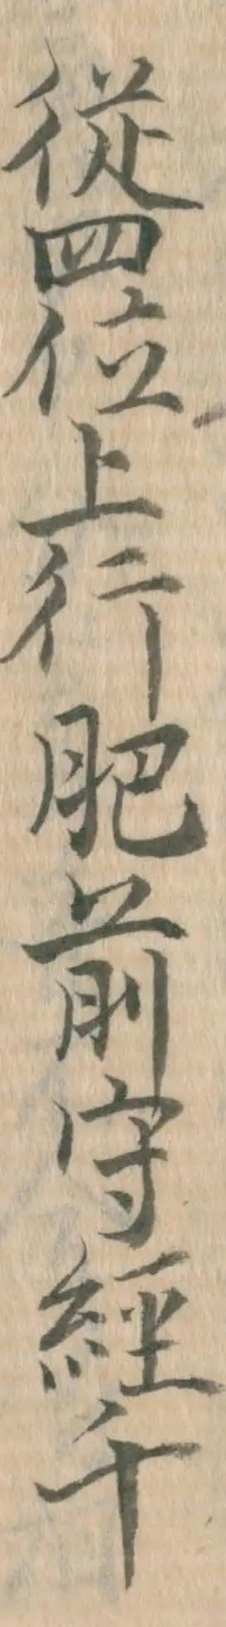従四位上行肥前守経千

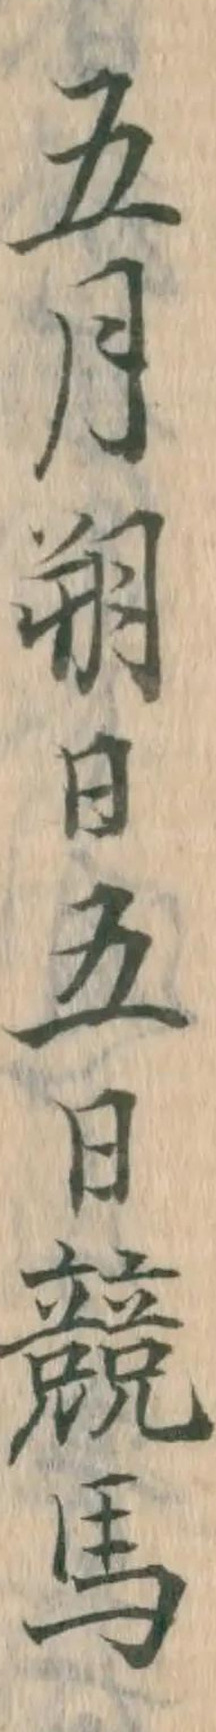五月朔日五日競馬
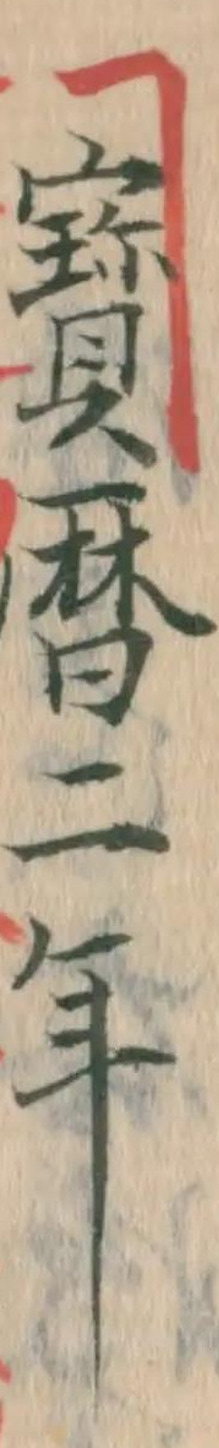宝暦二年
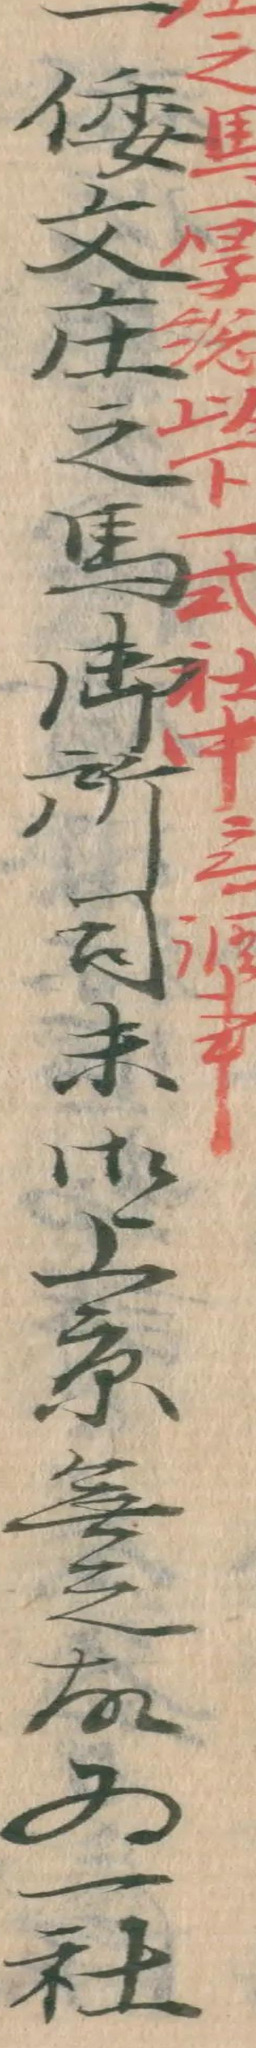一倭文庄之馬御所司未御上京無之故為一社
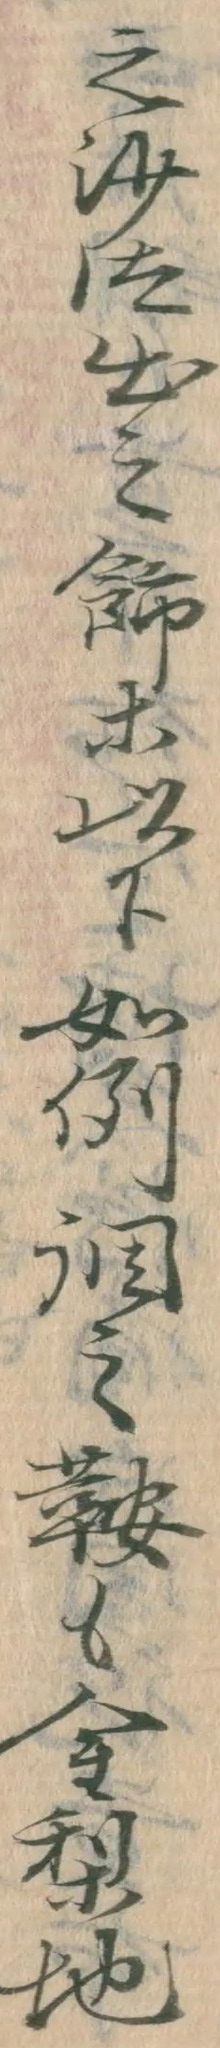之沙汰出之飾等以下如例調之鞍も金梨地
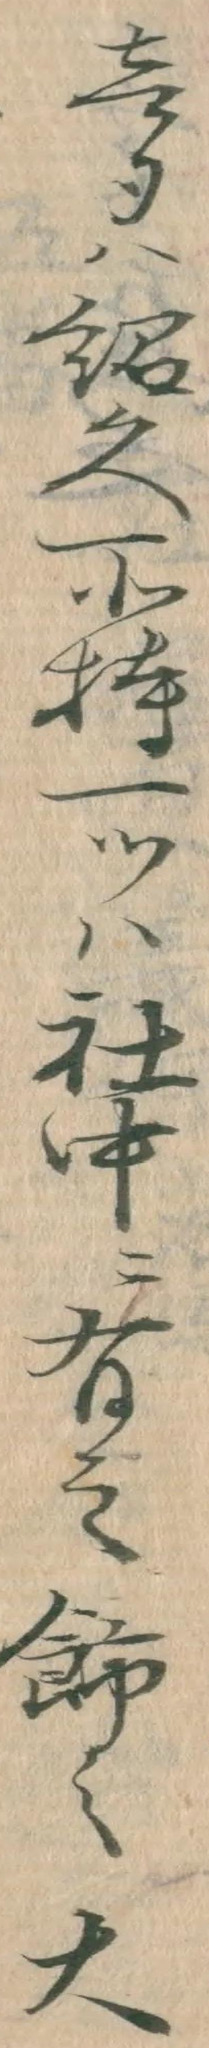壱匁ハ紹久所持一ツハ社中ニ有之飾之大
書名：賀茂社記録. 第10冊
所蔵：国立国会図書館 National Diet Library, JAPAN
